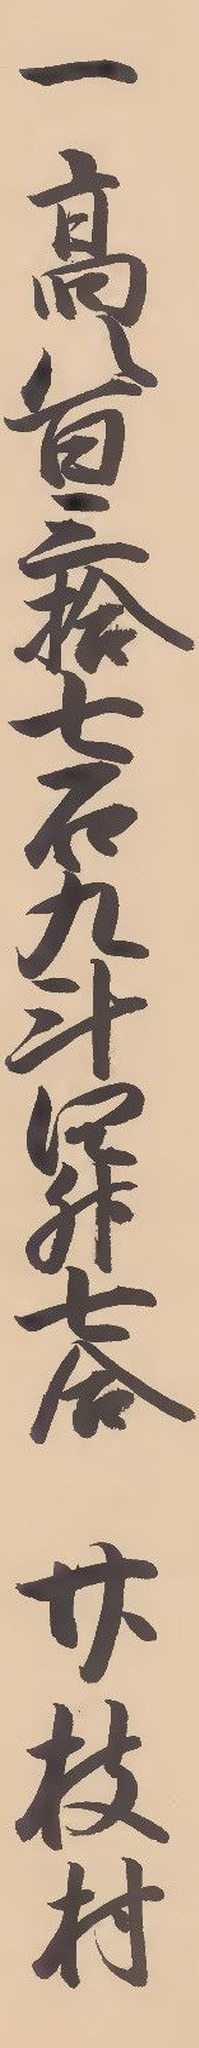一髙八百三拾七石九斗四升七合廿枝村

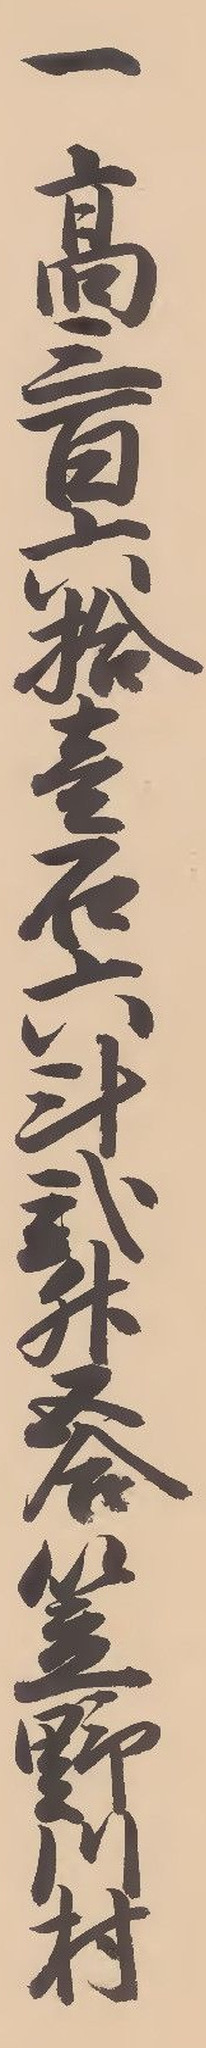一髙三百六拾壱石六斗壱升五合笠野川村
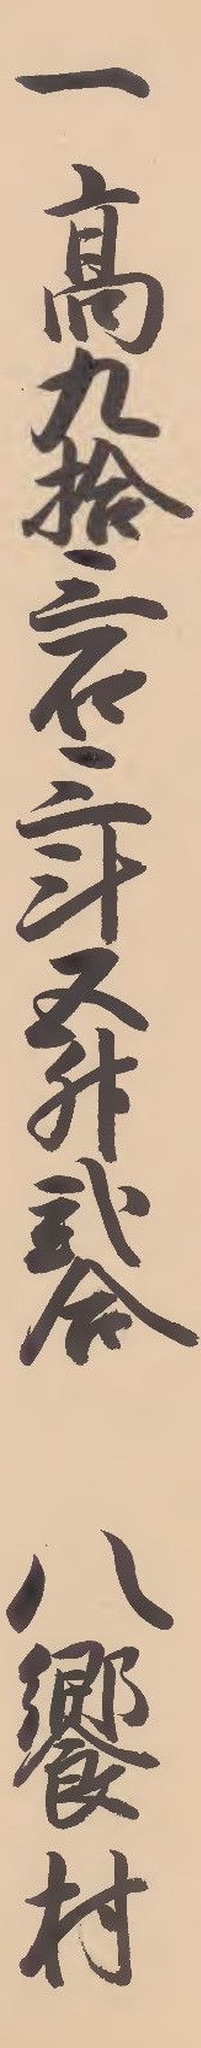一髙九拾三石三斗五升弐合八響村
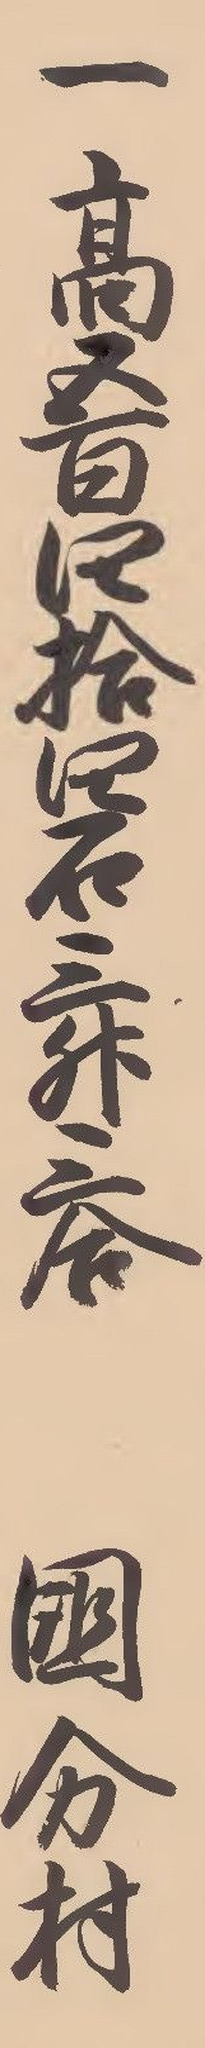一髙五百四拾四石三升三合國分村
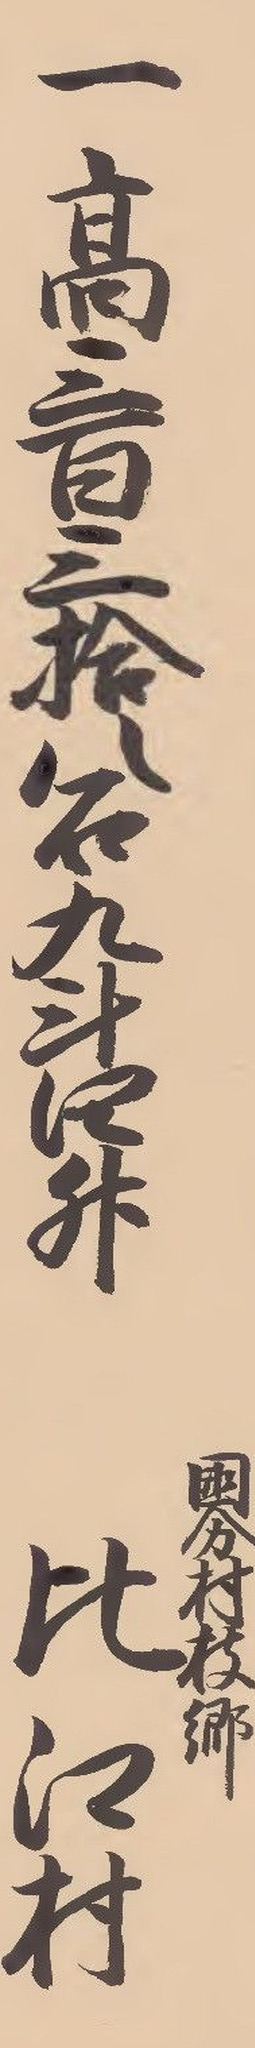一髙三百三拾八石九斗四升比江村
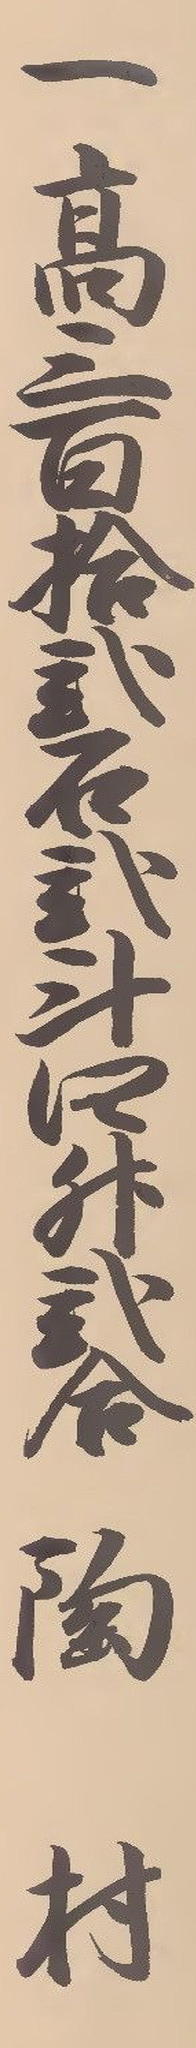一髙三百拾弐石弐斗四升弐合陶村
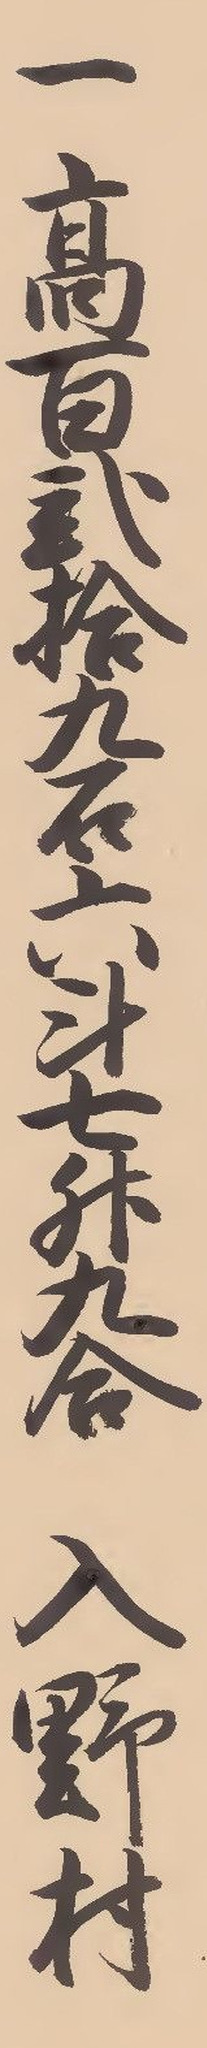一髙百弐拾九石六斗七升九合入野村
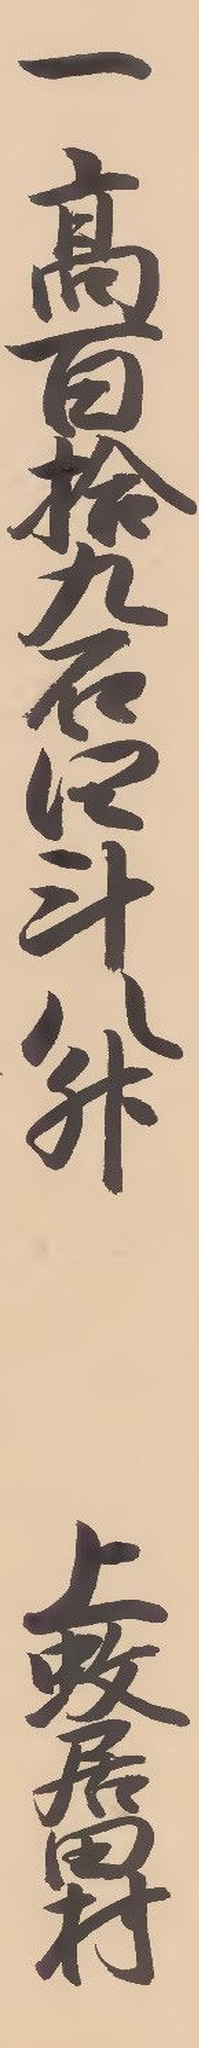一髙百拾九石四斗八升上蚊居田村
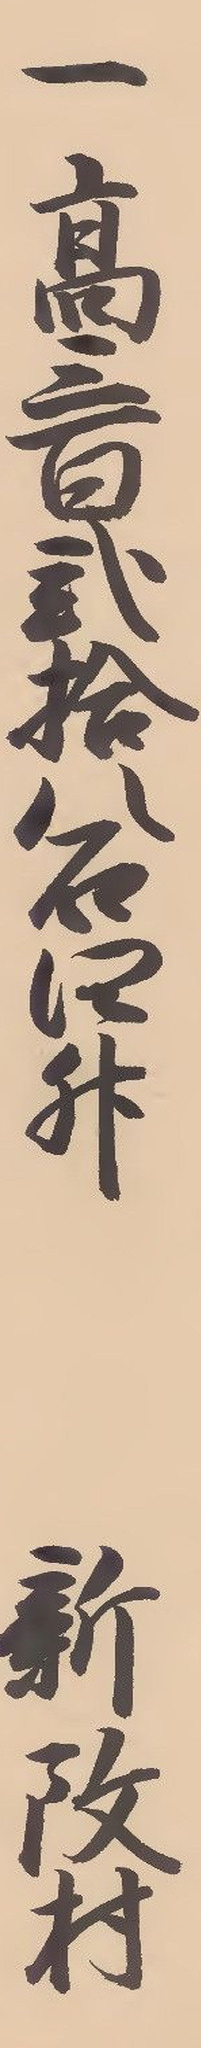一髙三百弐拾八石四升新改村

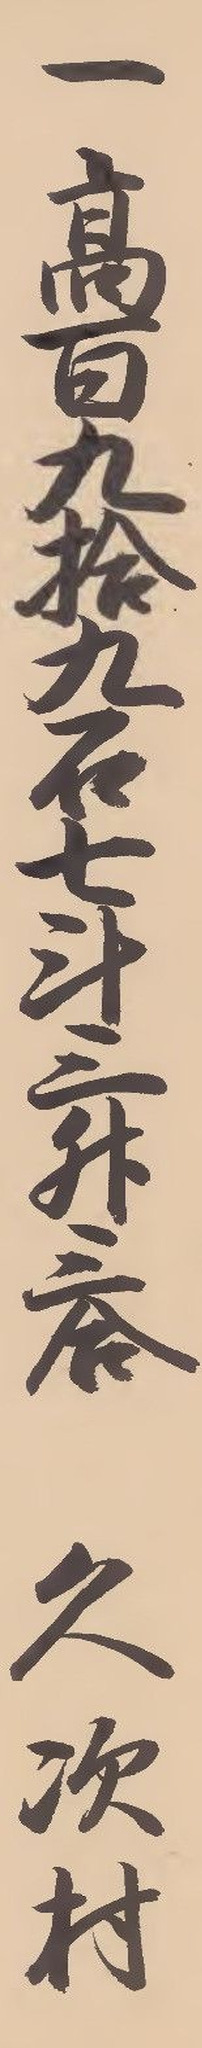一髙百九拾九石七斗三升三合久次村
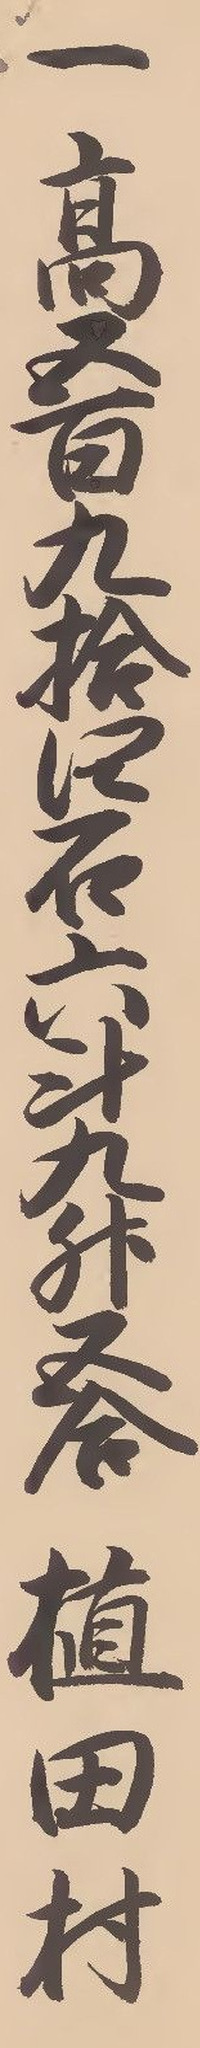一髙五百九拾四石六斗九升五合植田村
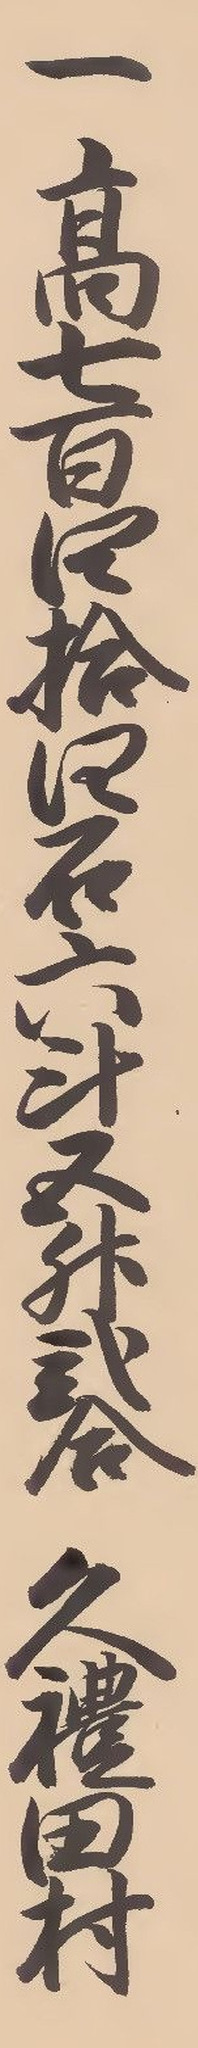一髙七百四拾四石六斗五升弐合久禮田村
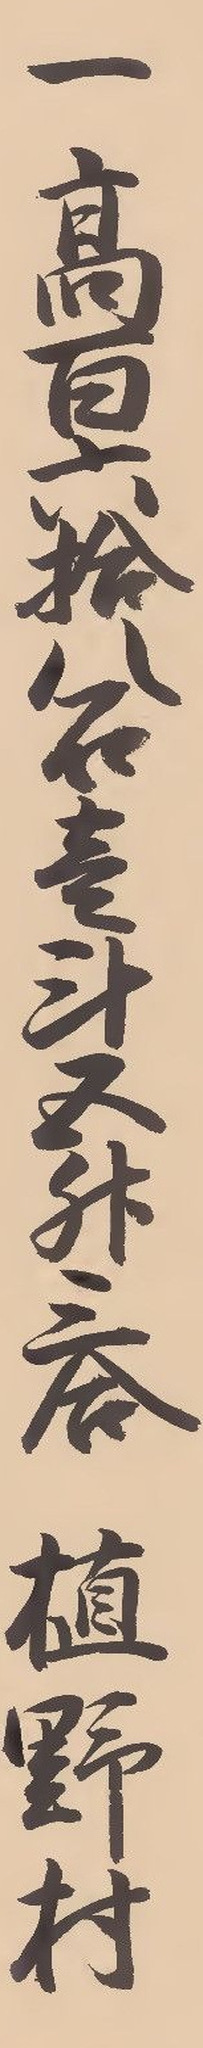一髙百六拾八石壱斗五升三合植野村
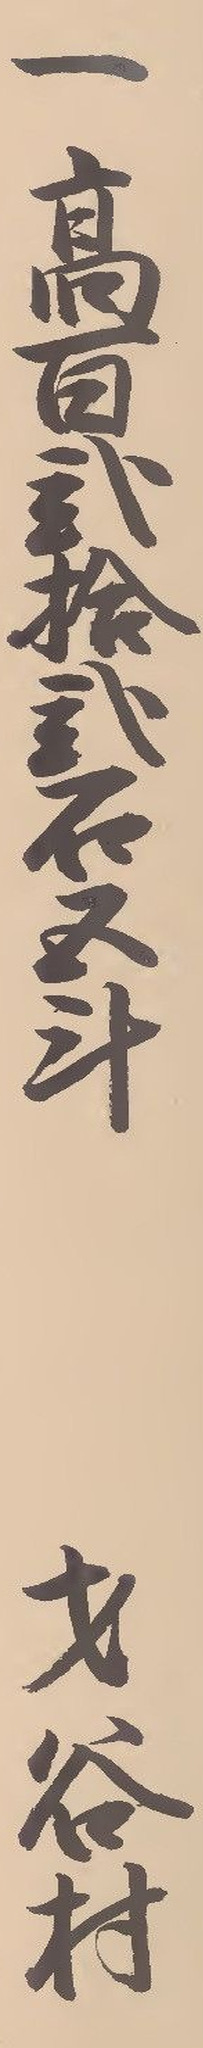一髙百弐拾弐石五斗才谷村
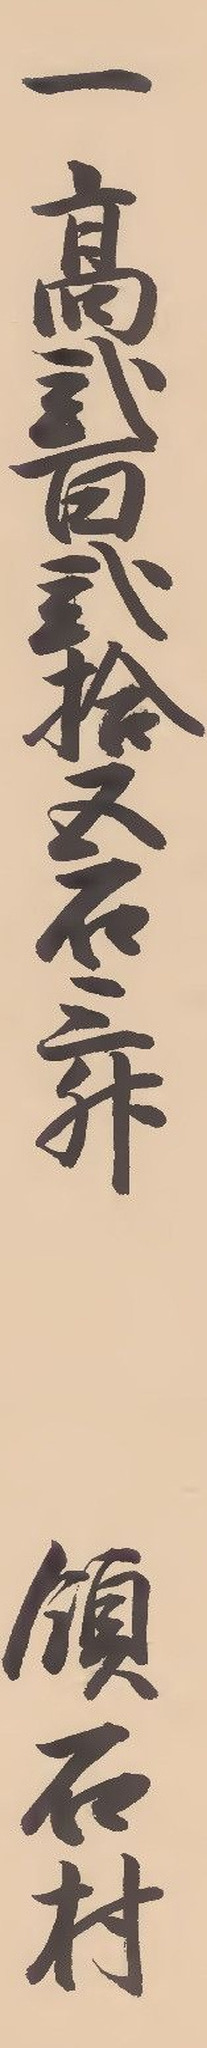一髙弐百弐拾五石三升領石村
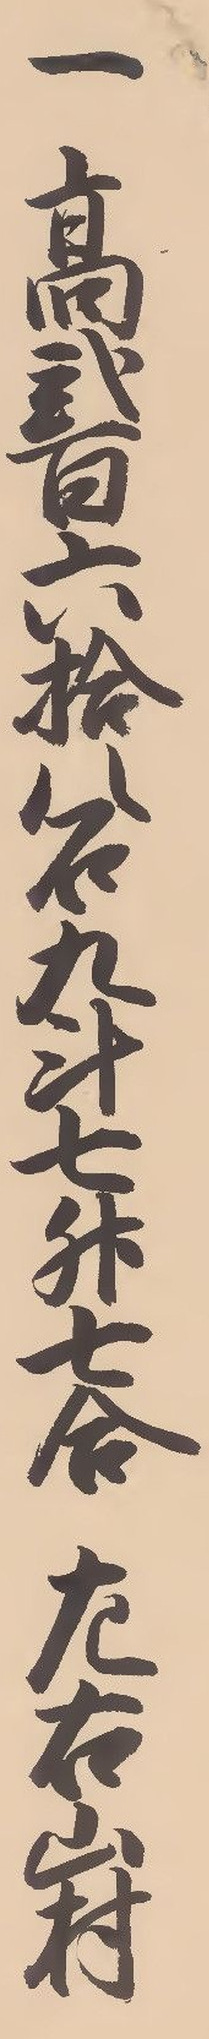一髙弐百六拾八石九斗七升七合左右山村
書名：土佐国郷帳
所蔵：国立公文書館 National Archives of Japan
